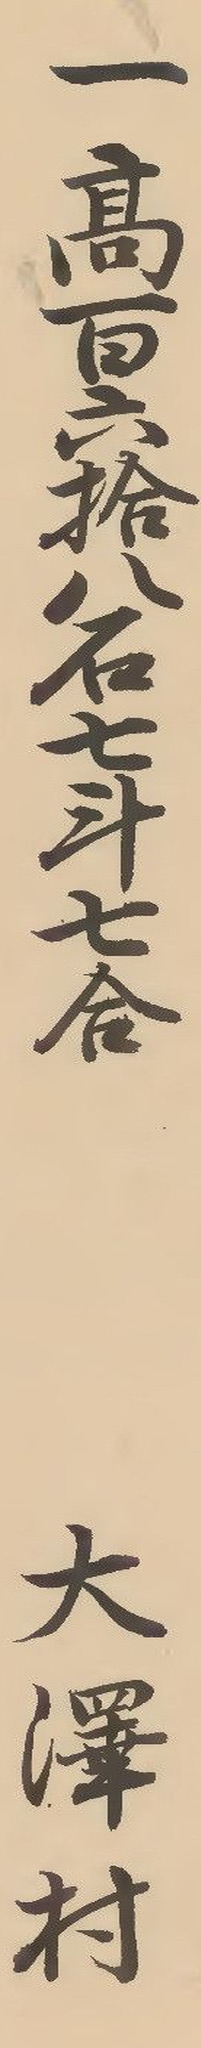一高百六拾八石七斗七合大沢村
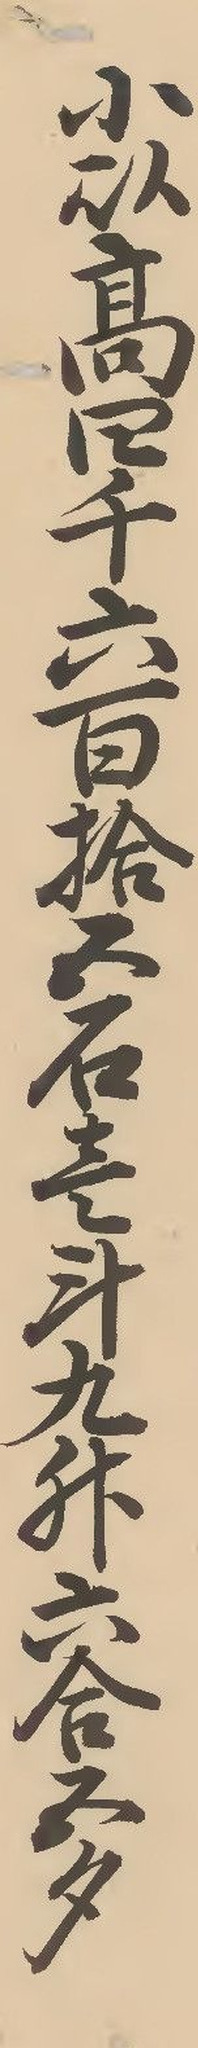小以高四千六百拾五石壱斗九升六合五勺
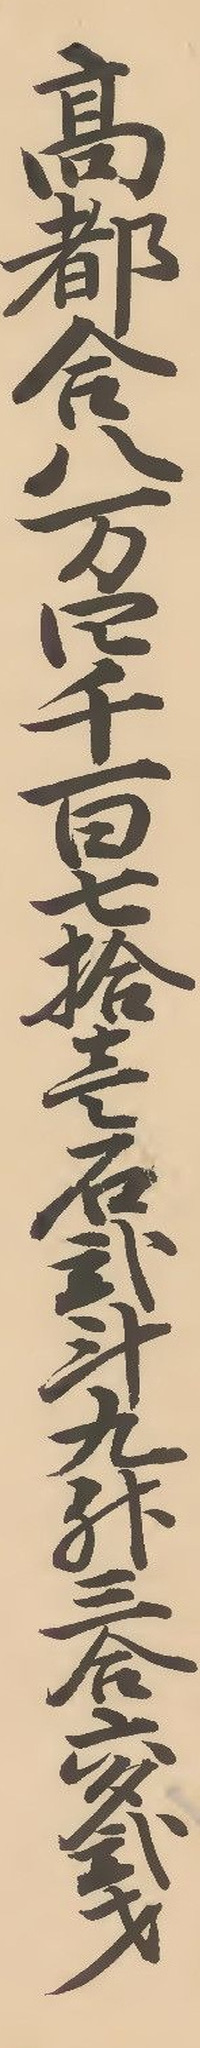高都合八万四千百七拾壱石弐斗九升三合六勺弐才
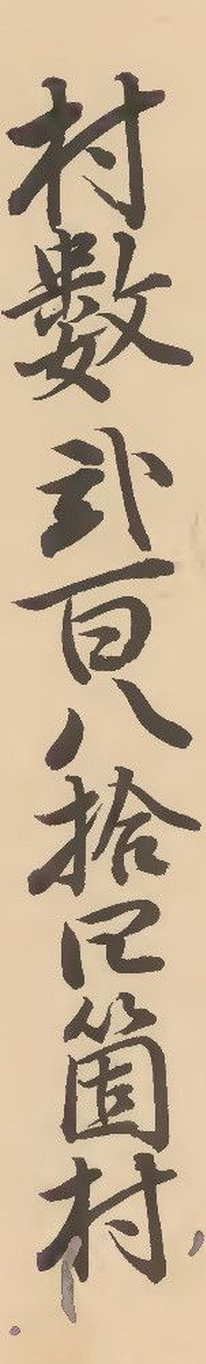村数弐百八拾四箇村

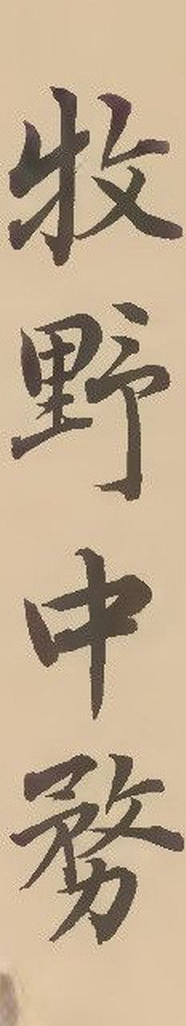牧野中務
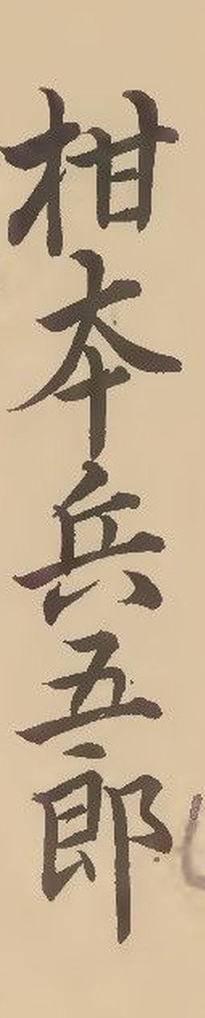柑本兵五郎
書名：伊豆国郷帳
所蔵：国立公文書館 National Archives of Japan
